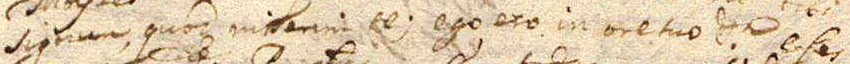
signum, quod miserim te; ego ero in ore tuo &.a e fes
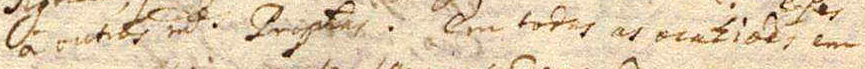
a outros m.tas Prophas. em todas as ocazioẽs em
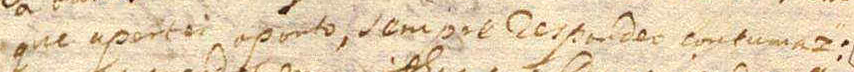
que apertei a ponto, sempre Respondeo contumaz
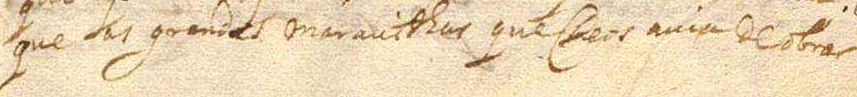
que as grandes marauilhas que Deos auia de obras
